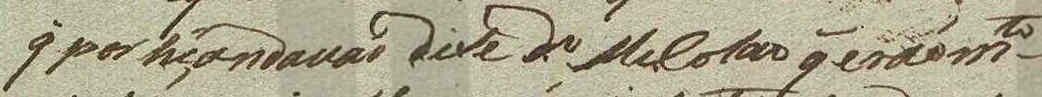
q̄ por hi andauaõ dise d.o NiColao q̄ eraõ m.to
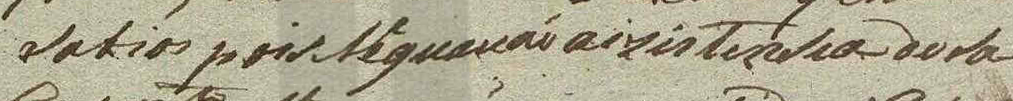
sabios pois Neguauaõ a izistensia do sa
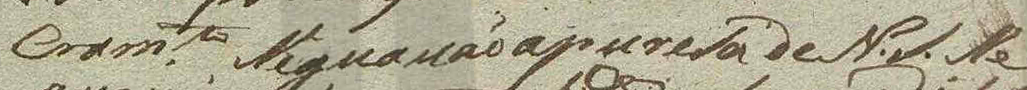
cram.to, Neguauaõ a puresa de N. S. Ne
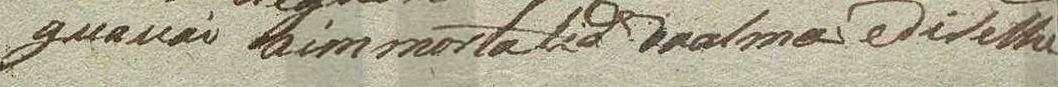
guauaõ a immortalid.e da alma e diselhe
